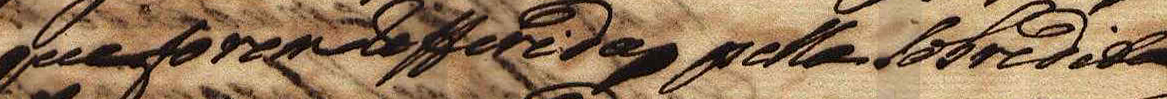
que forem Refferidas pella sobredita
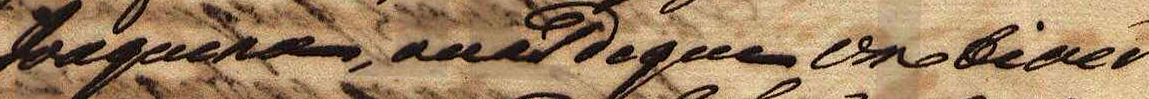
Joaquena, ou as de que vm tiver
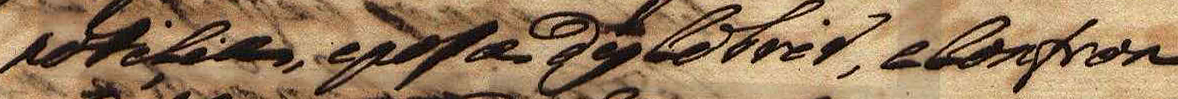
notiÇias, e posa desCobrir, e Confron
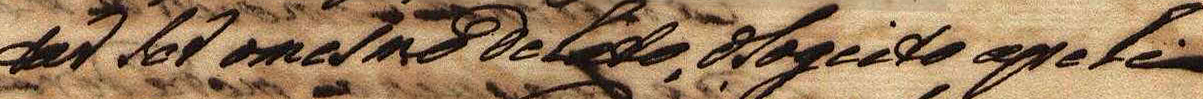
tar ser o mesmo deLato, o sogeito apeli
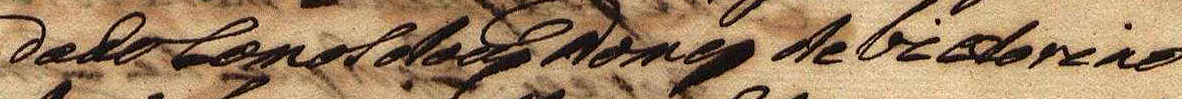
dado Com os dous nomes de Victorino
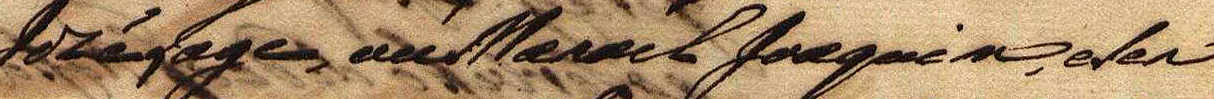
Jozé Lage, ou Manoel Joaquim, e sen
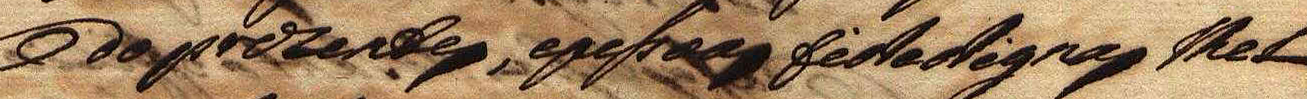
do prezentes, e pessoas fidedignas lhes
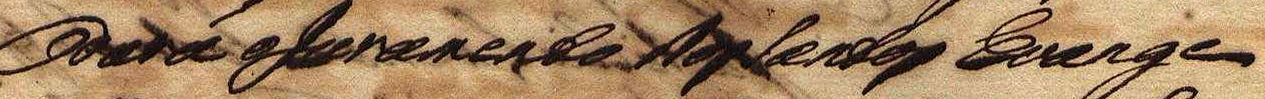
dará o Juramento dos santos Evange
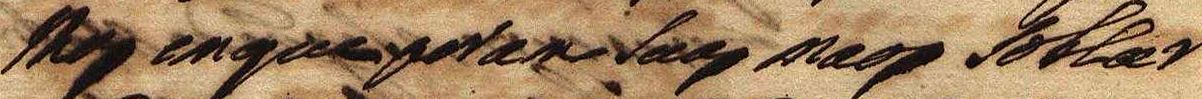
lhos em que poram suas maos sobCar
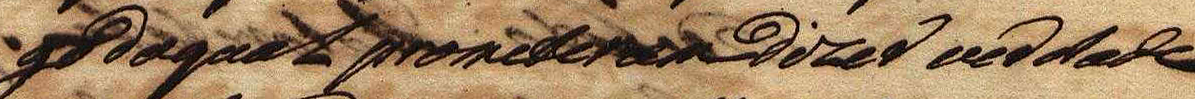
go do qual prometeram dizer verdade
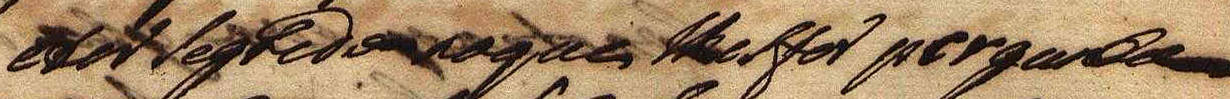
e ter segredo no que lhe for pergunta
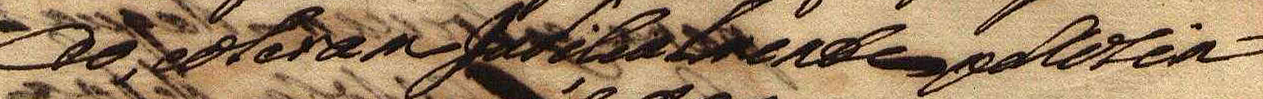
do, e o seram JudiÇialmente poloz en
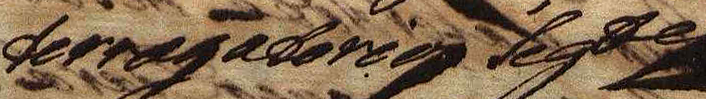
terrogatorios seg.tes
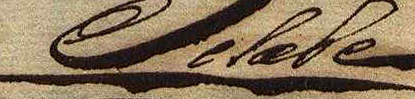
Se sabe
